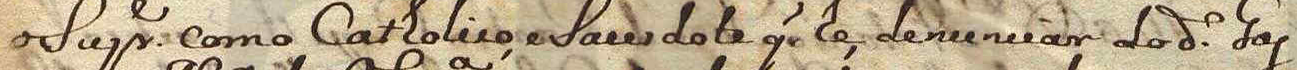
o Sup.e como Catholico, e Sacerdote q̄ he, denunciar do d.o Gas
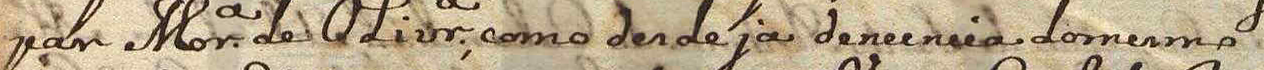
par Mor.a de OLivr.a; como desde ja denuncia do mesmo
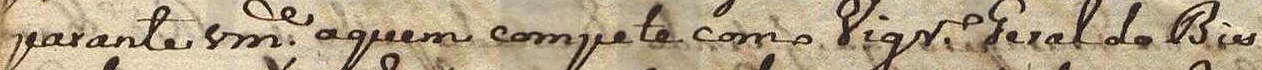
parante v m.ce, a quem compete com o Vigr.o Geral do Bis
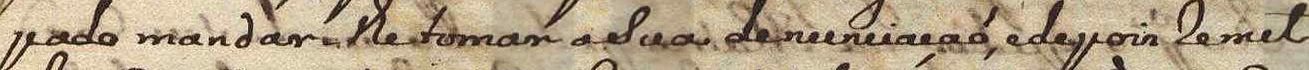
pado mandar-lhe tomar a Sua denunciaçaõ, e depois Remet
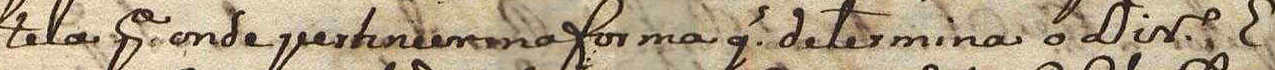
tela p.a onde pertencer na forma q̄ determina o Dir.o E
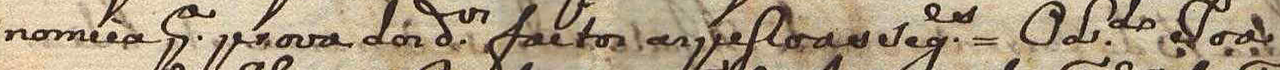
nomeia p.a prova dos d.os factos as pessoas seg.tes= O L.do Ioa
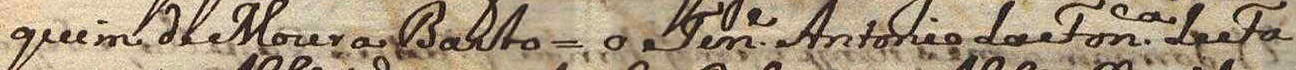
quim de Moura Basto= o Ten.e Antonio da Fon.ca de Fa
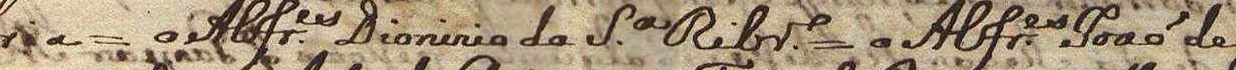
ria= o Alfr.es Dionizio da S.a Ribr.o= o Alfr.es Ioaõ de
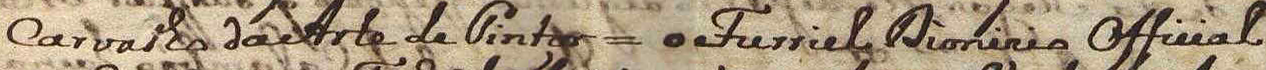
Carvalho da Arte de Pintar= o Furriel Dionizio Official
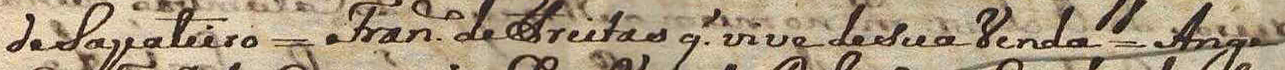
de Sapateiro= Fran.co de Freitas q̄ vive de sua Venda= Ange
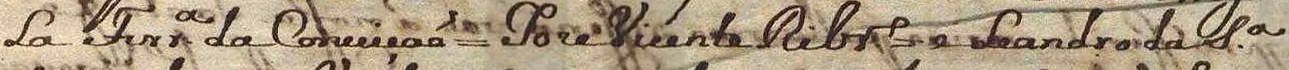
La Ferr.a da Conceiçaõ = Ioze Vicente Ribr.o = e Leandro da S.a
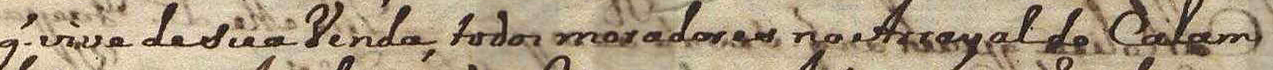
q̄ vive de sua Venda, todos moradores no Arrayal do Calam
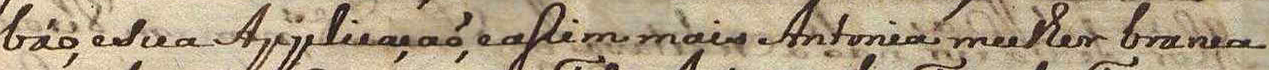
báo, e sua Applicaçaõ, e assim mais Antonia mulher branca
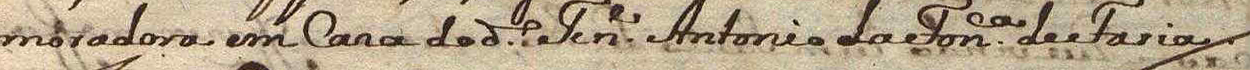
moradora em Caza do d.o Ten.e Antonio da Fon.ca de Faria
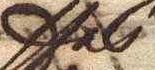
ffas
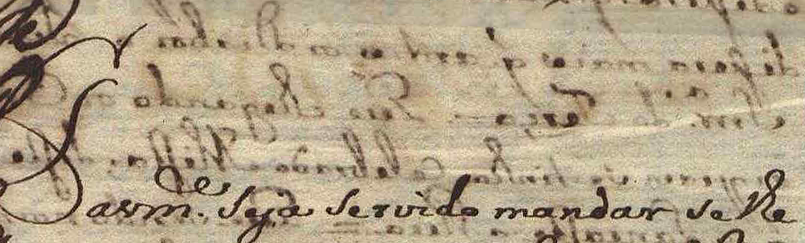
Sr a v m.ce seja servido mandar se lhe
